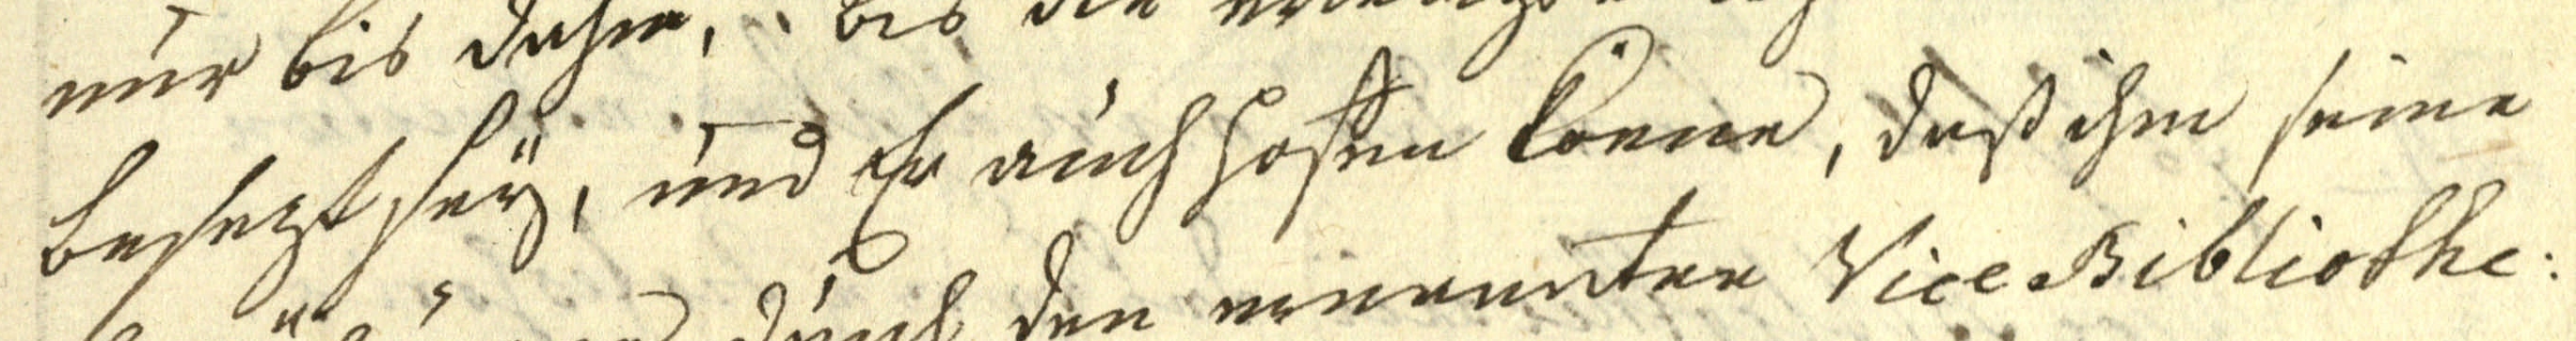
besezt seÿ, und Er auch hoffen könne, daß ihm seine
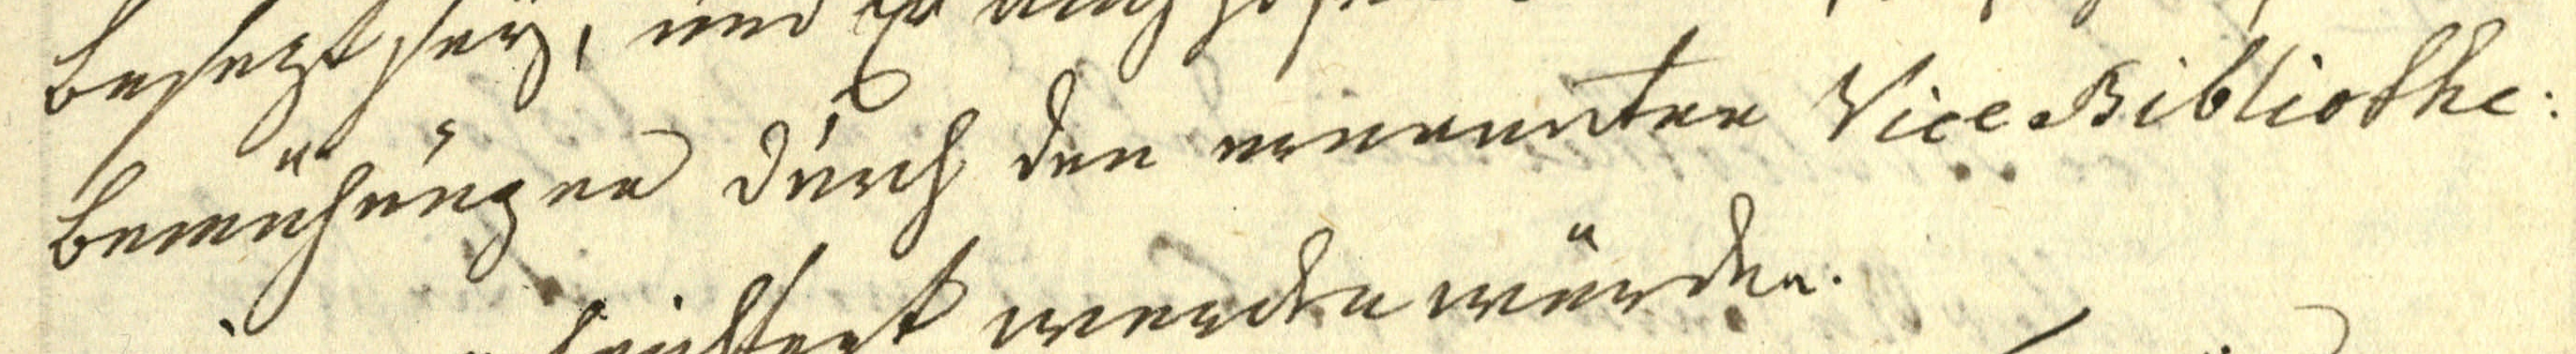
Bemühungen durch den ernannten Vice Bibliothe¬
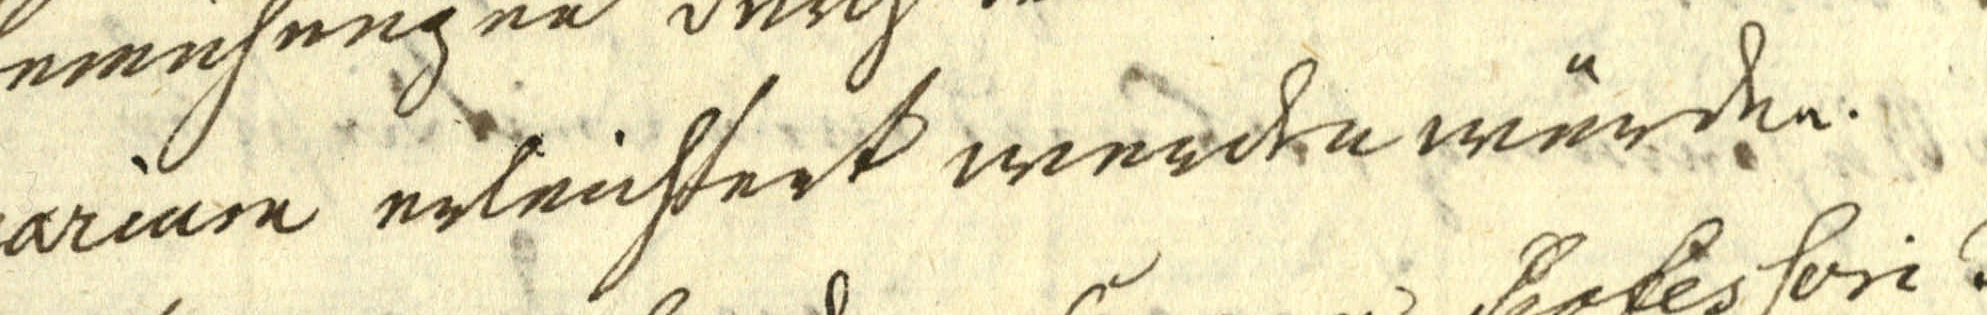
carium erleichtert werden würden.
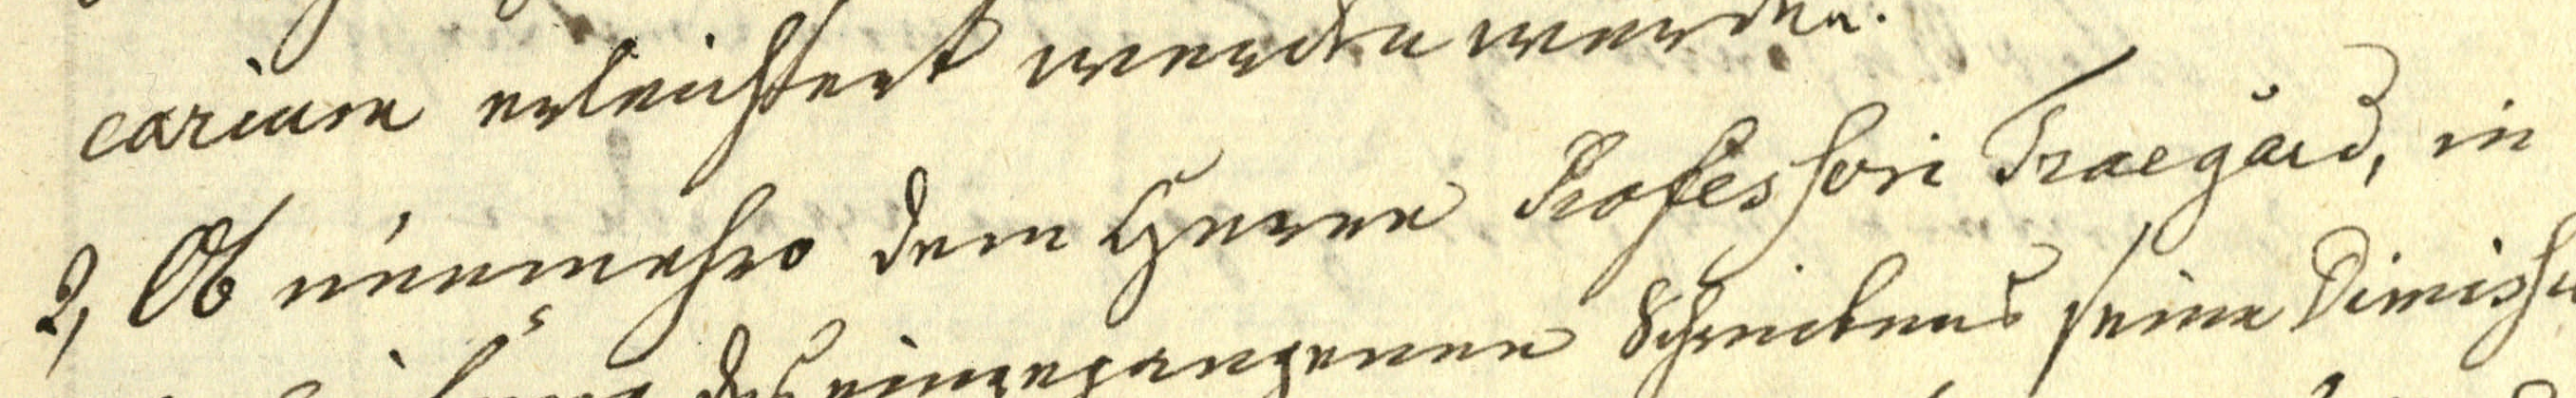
2. Ob nunmehro dem Herrn Professori Traegård, in
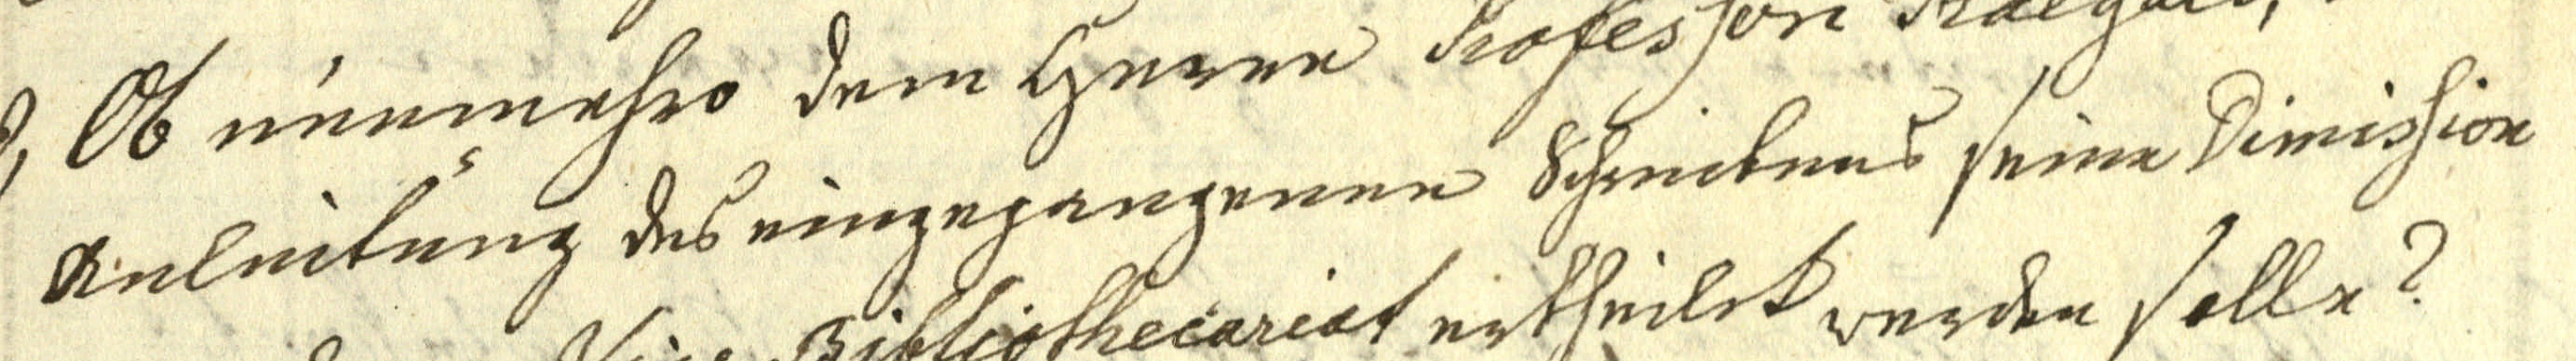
Anleitung des eingegangenen Schreibens seine Dimission
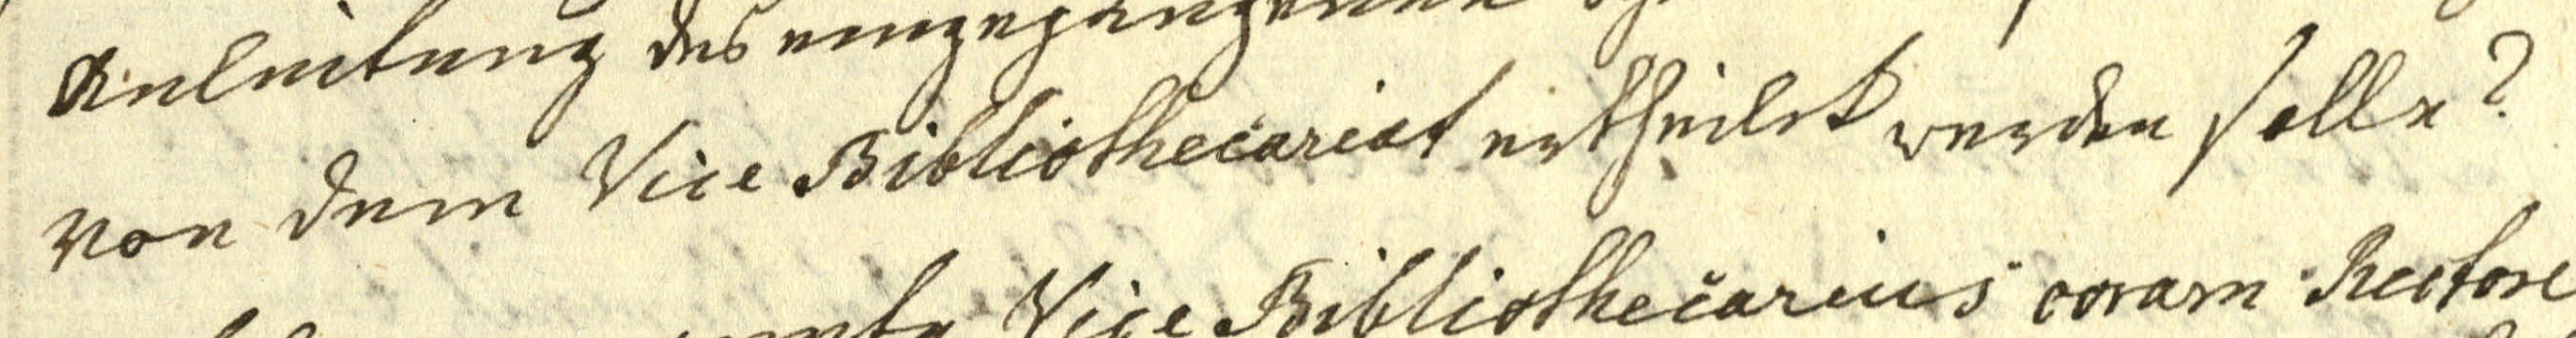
von dem Vice Bibliothecariat ertheilet werden solle?
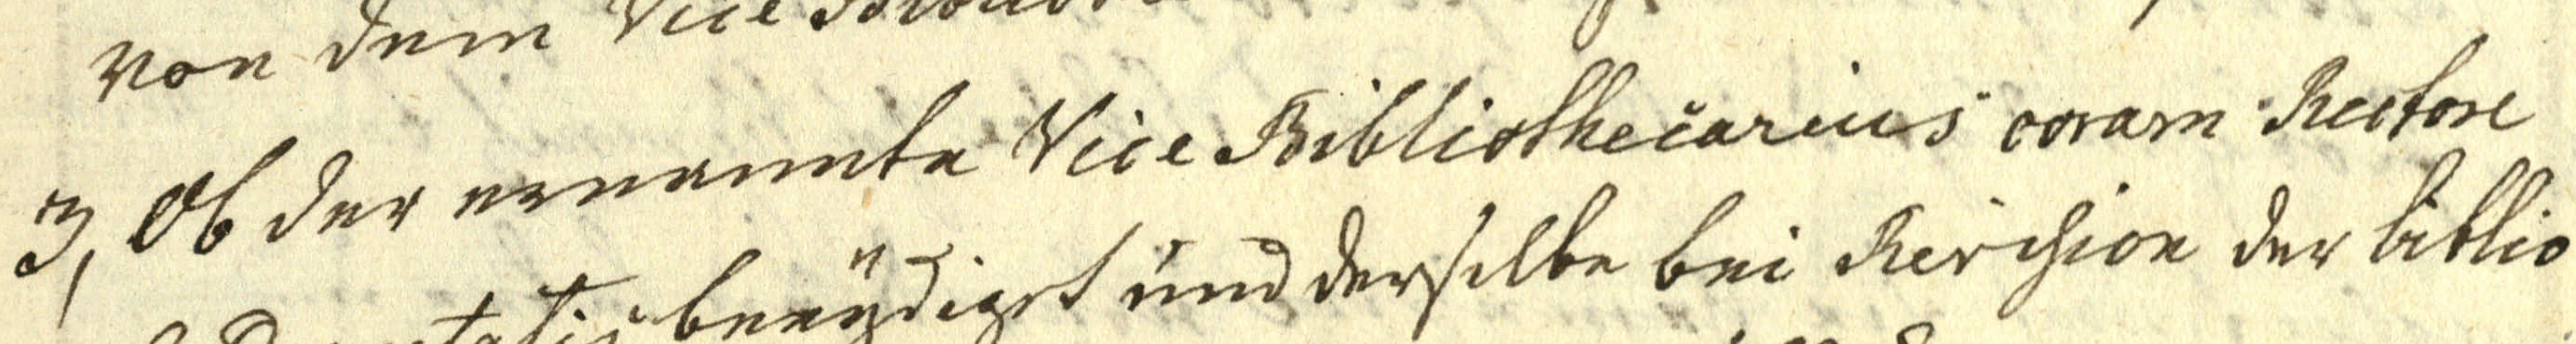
3. Ob der ernannte Vice Bibliothecarius coram Rectore
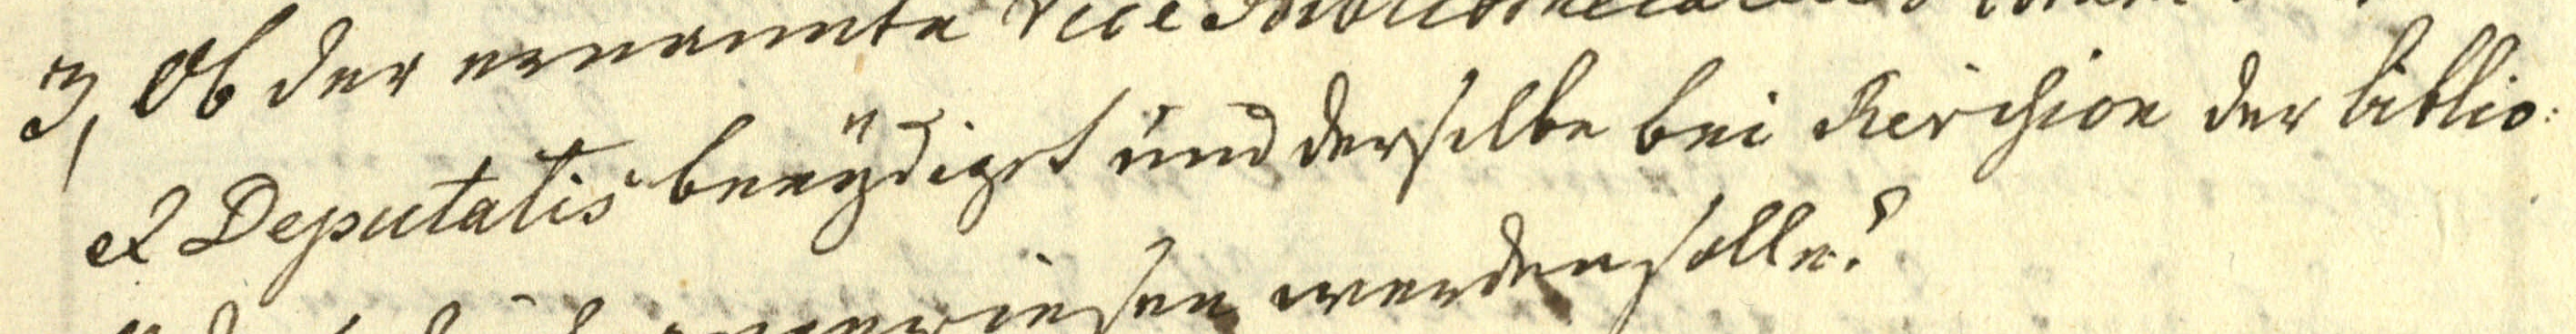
et Deputatis beeÿdiget und derselbe bei Revision der Biblio¬
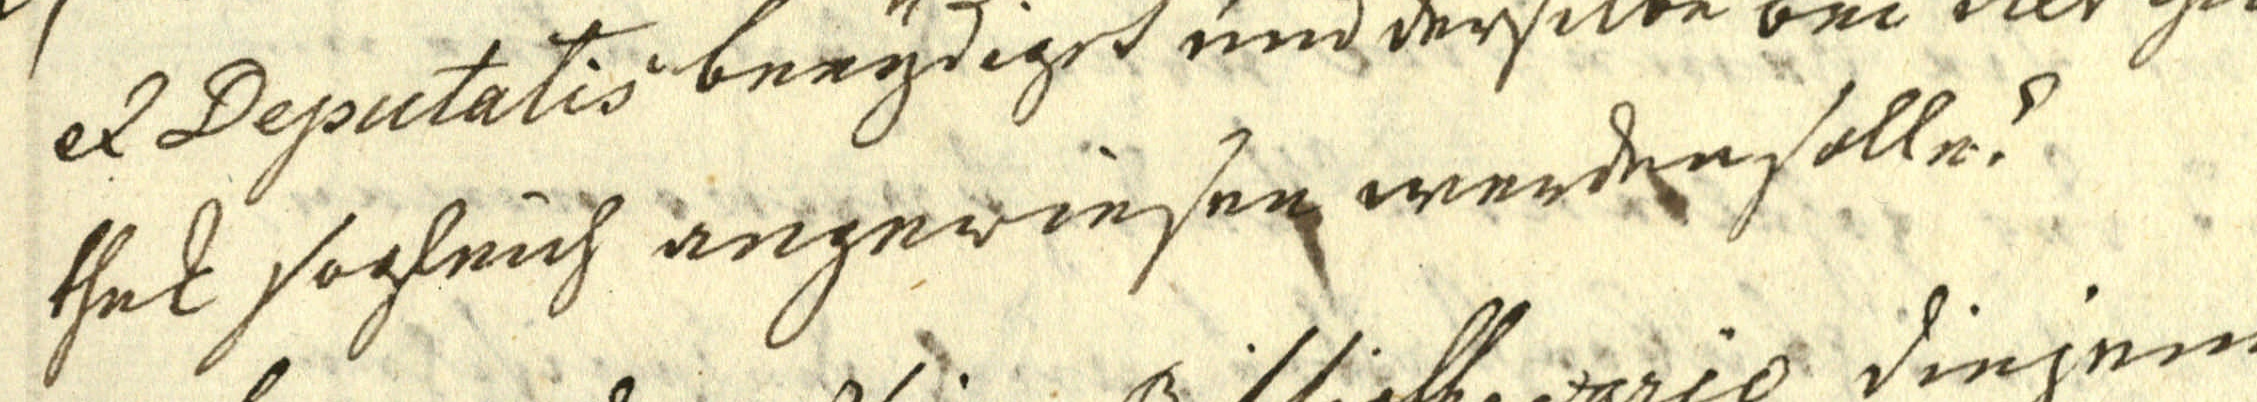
thek sogleich angewiesen werden solle?
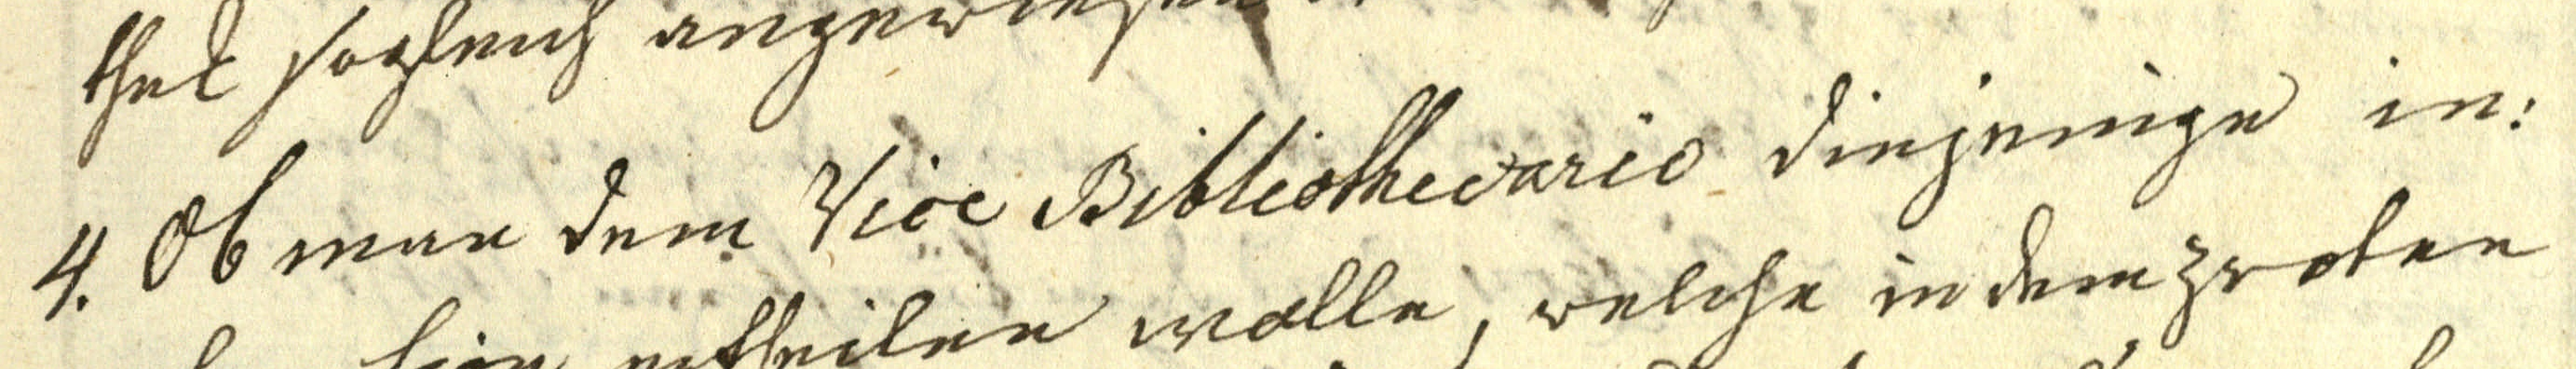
4. Ob man dem Vice Bibliothecario diejenige in¬
